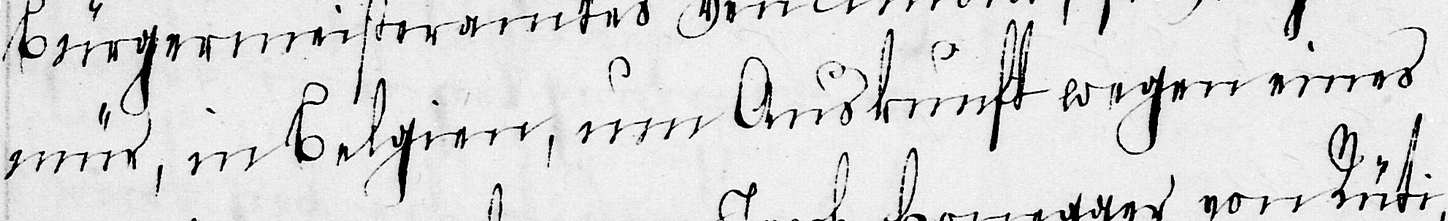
mür, in Belgien, um Auskunft wegen eines
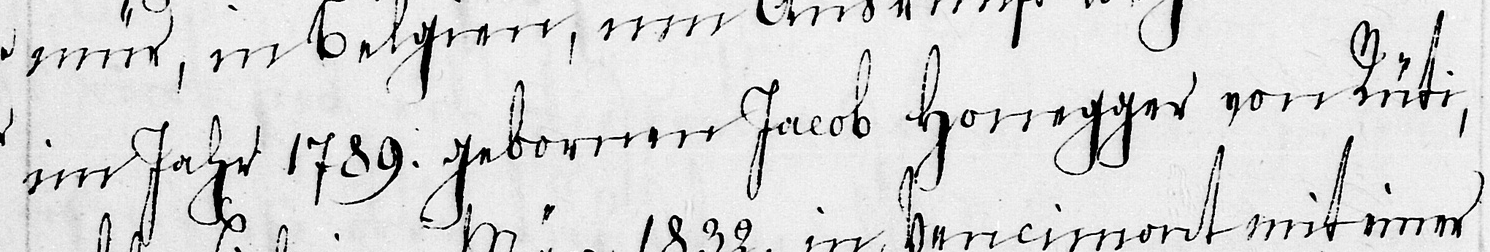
im Jahr 1789. gebornen Jacob Honegger von Rüti,
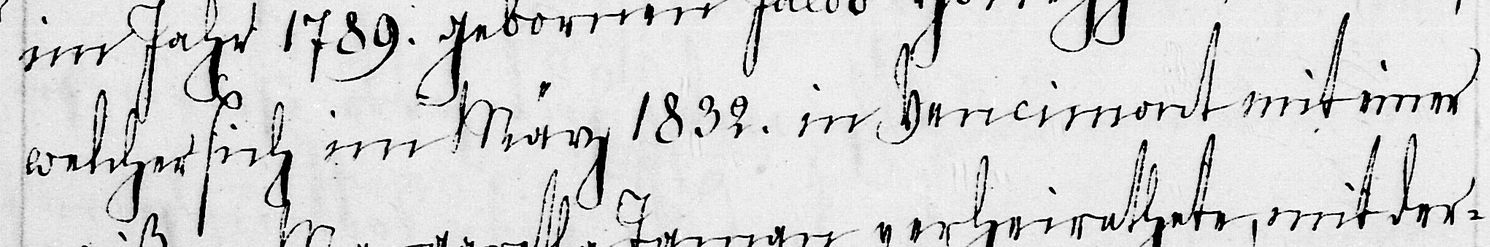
welcher sich im März 1832. in Vencimont mit einer
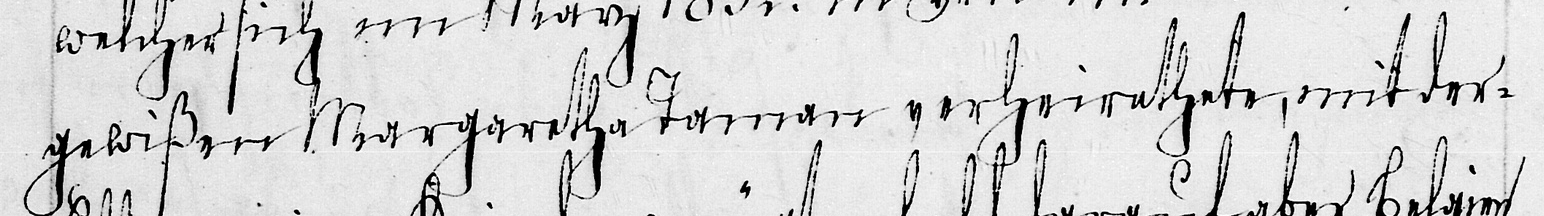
gewißen Margaretha Taman verheirathete, mit der¬
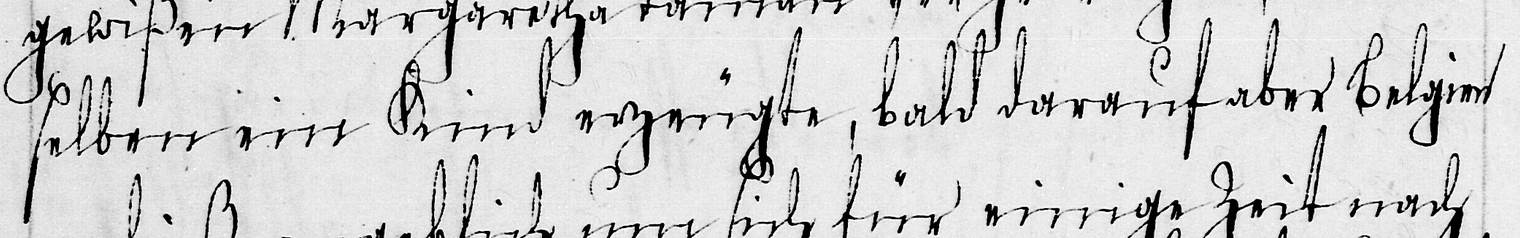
selben ein Kind erzeugte, bald darauf aber Belgien
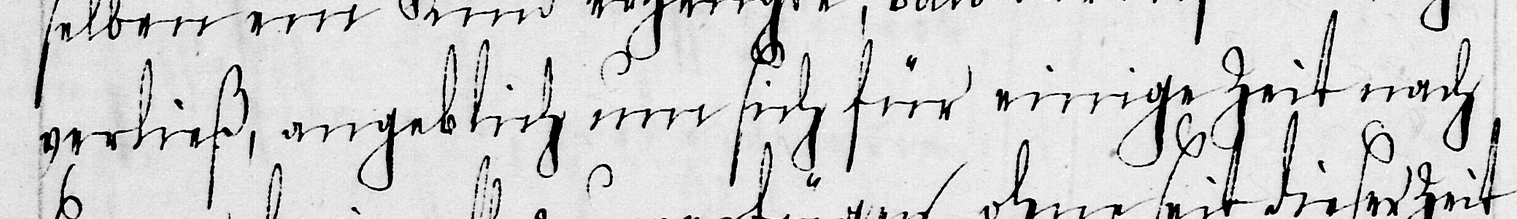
verließ, angeblich um sich für einige Zeit nach
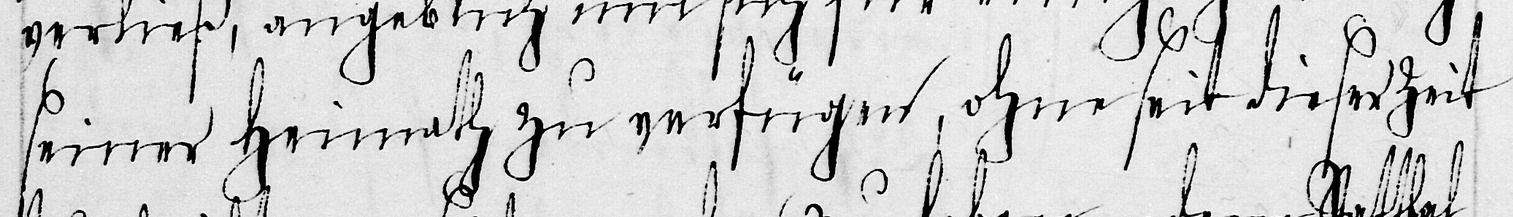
seiner Heimath zu verfügen, ohne seit dieser Zeit
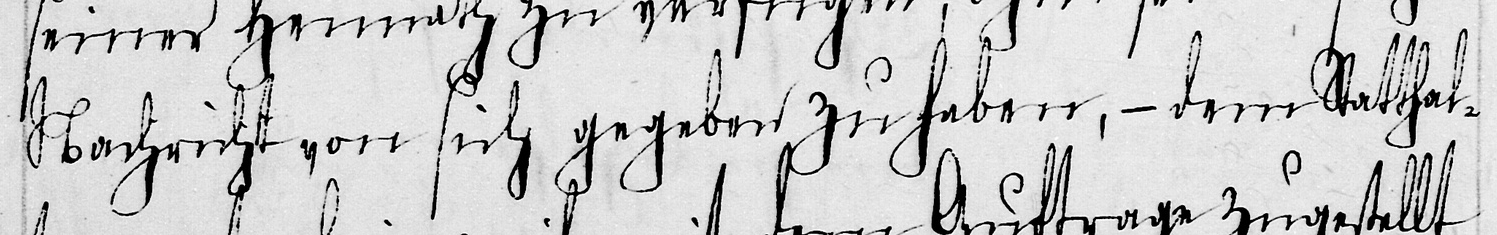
Nachricht von sich gegeben zu haben, – dem Stattha¬
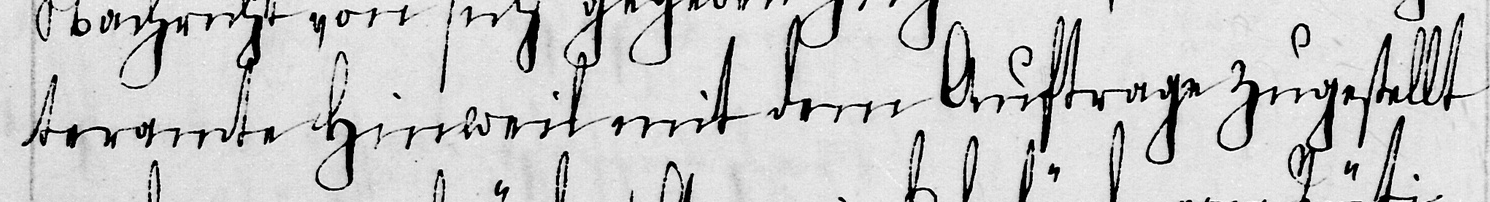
lteramte Hinweil mit dem Auftrage zugestellt
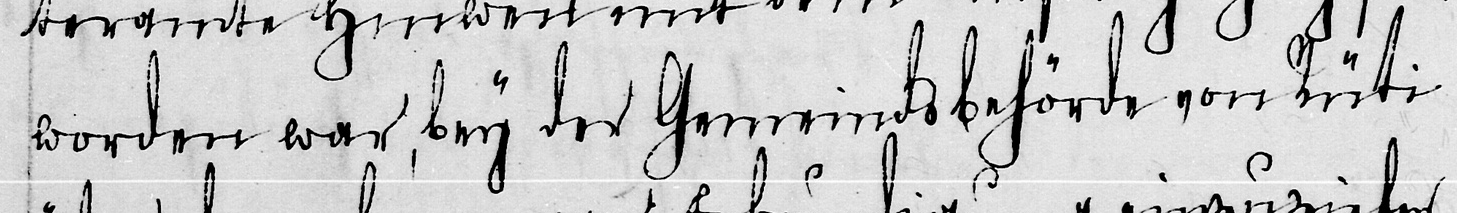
worden war, bey der Gemeindsbehörde von Rüti
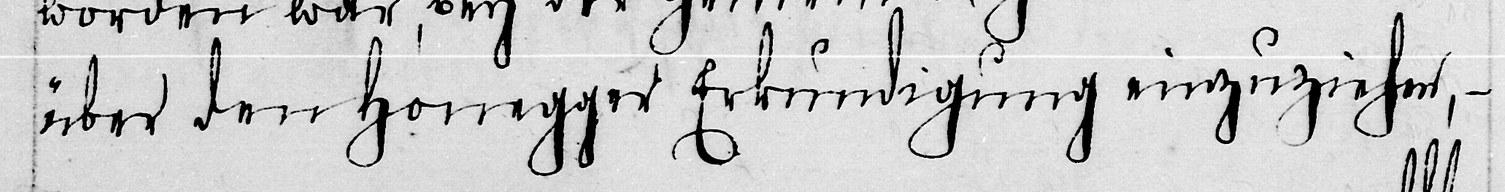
über den Honegger Erkundigung einzuziehen,
